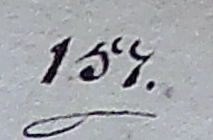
157.
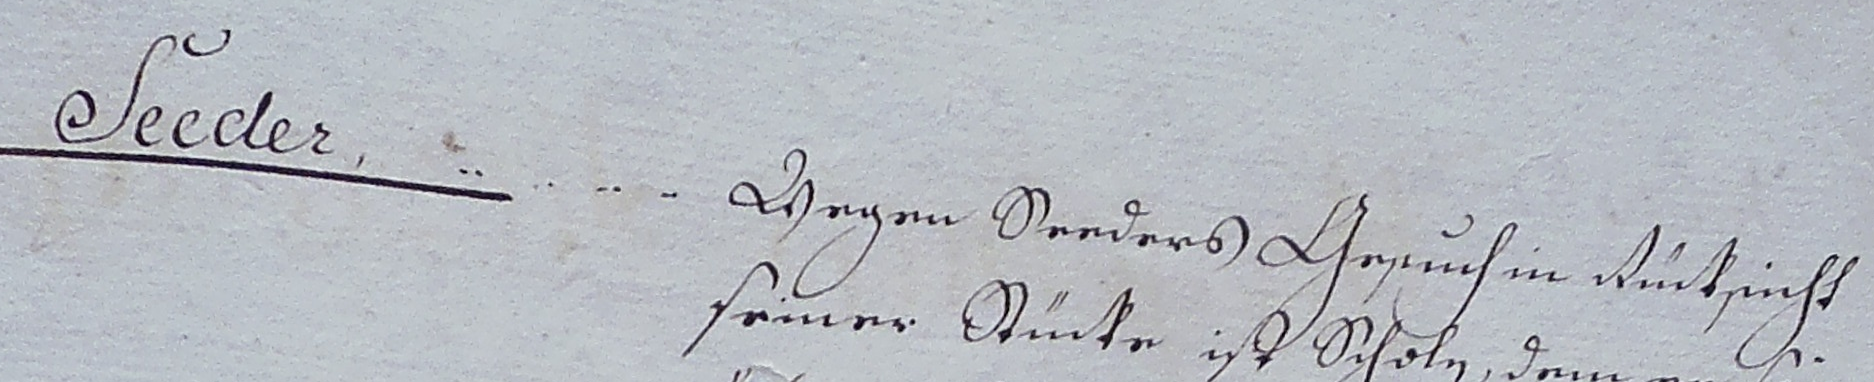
Seeder. .. .. .. .. Wegen Seeders Gesuch in Rüksicht
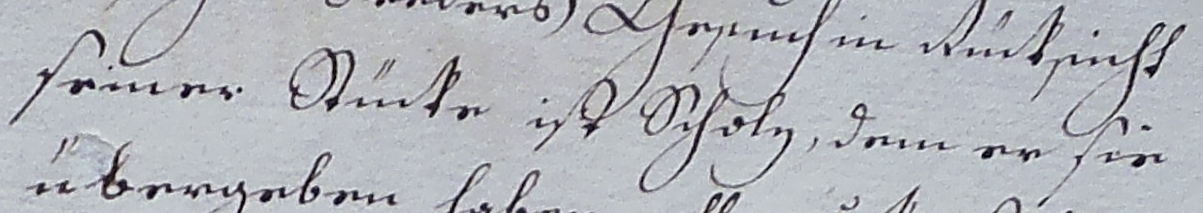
seiner Stücke ist Scholz, dem er sie
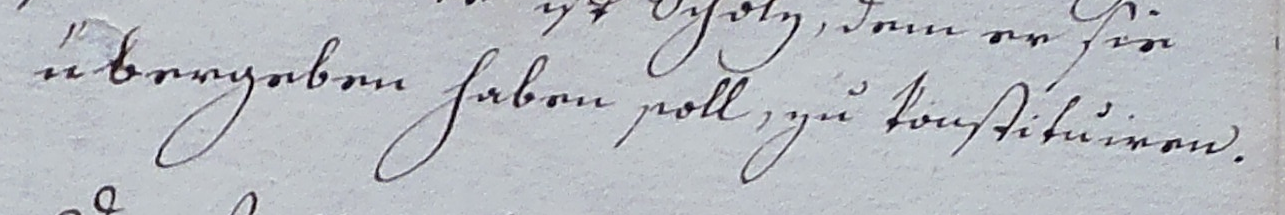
übergeben haben soll, zu konstituiren.
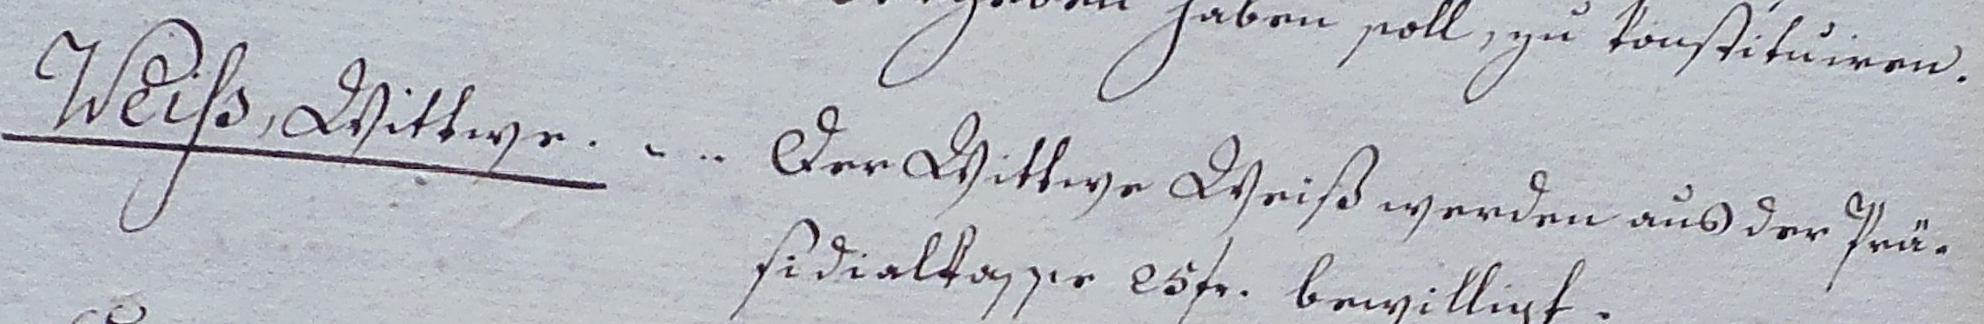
Weihs, Wittwe. .. .. Der Witwe Weiß werden aus der Prä¬
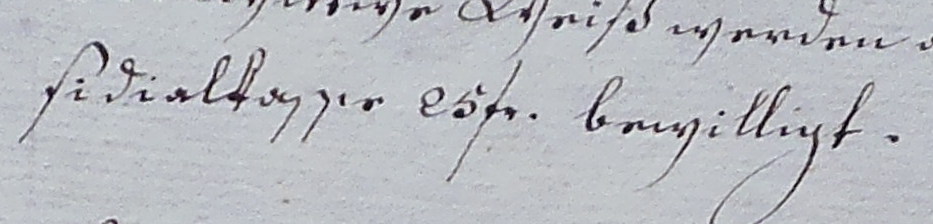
sidialkasse 25fr. bewilligt.
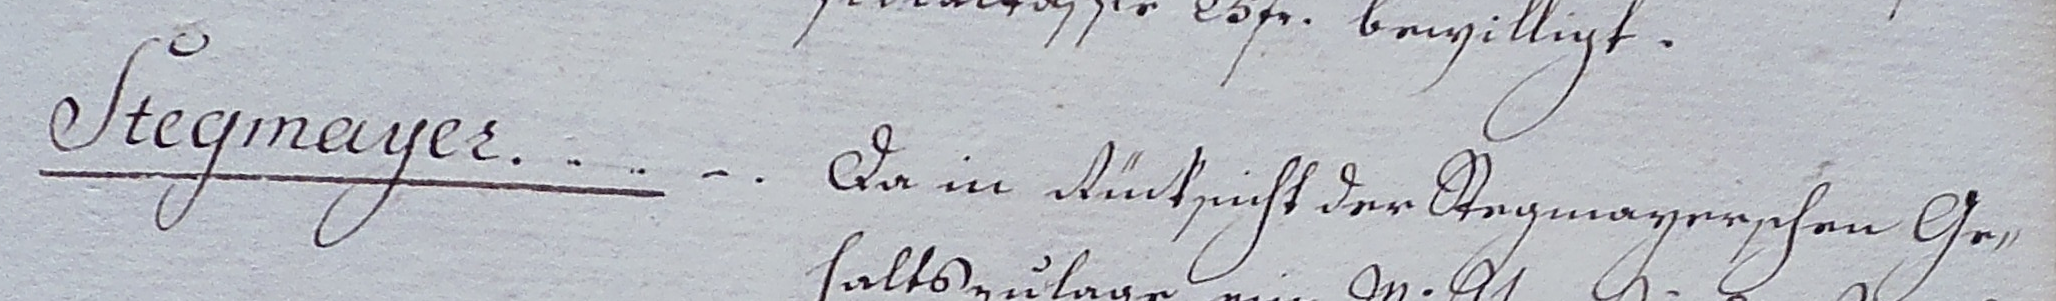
Stegmayer. .. .. .. . Da in Rücksicht der Stegmayerschen Ge¬
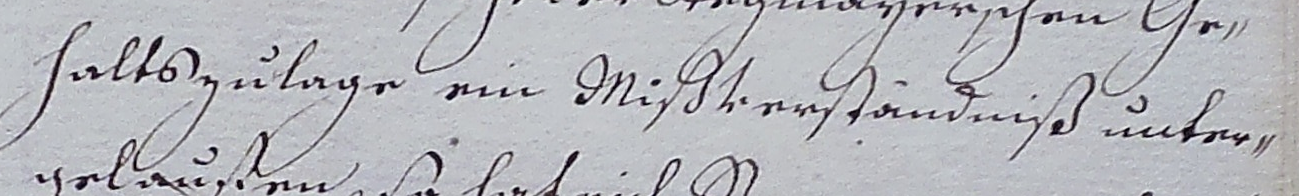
haltszulage ein Mißverständniß unter¬
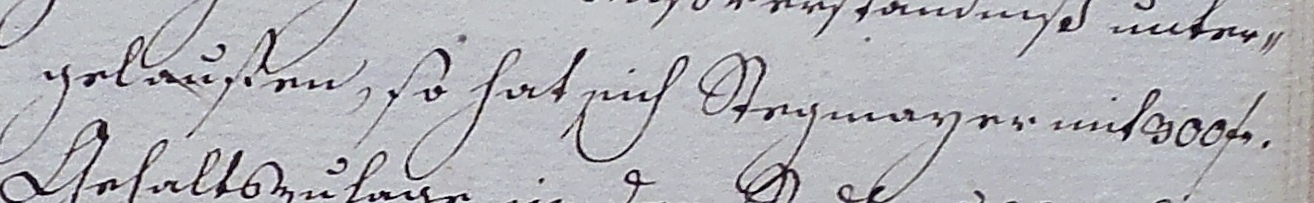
gelaufen, so hat sich Stegmayer mit 300fr.
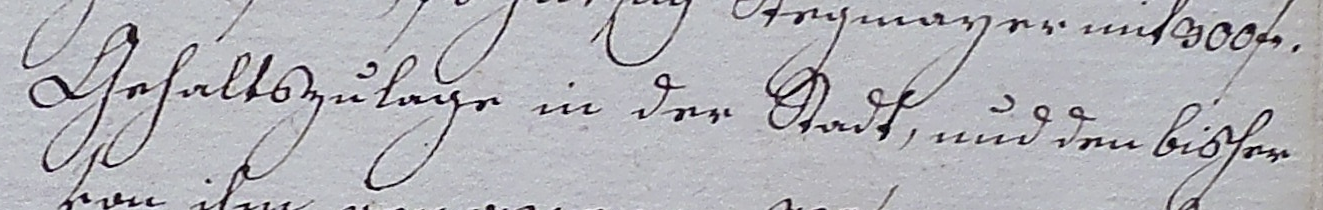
Gehaltszulage in der Stadt, und den bisher
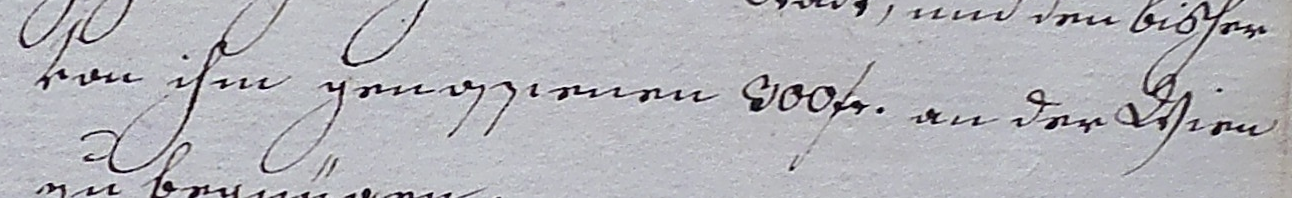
von ihm genossenen 300fr. an der Wien
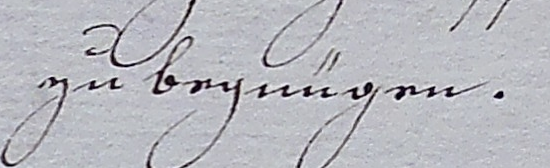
zu begnügen.
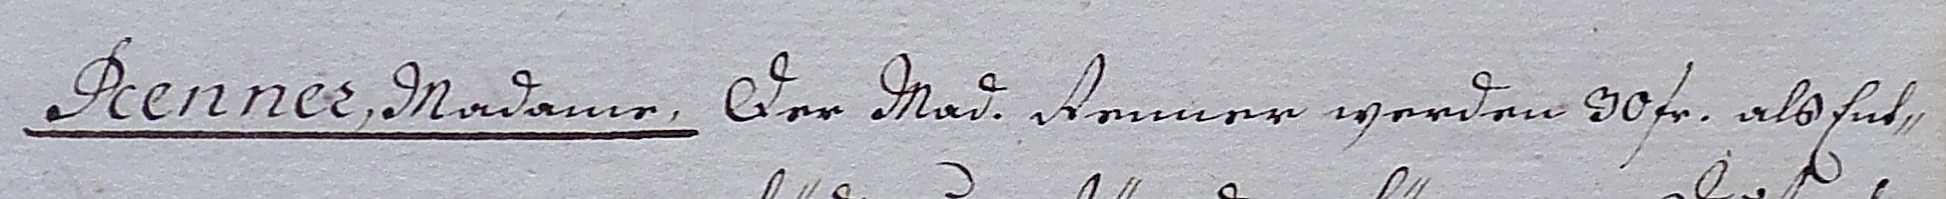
Renner, Madame. Der Mad. Renner werden 30fr. als Ent¬
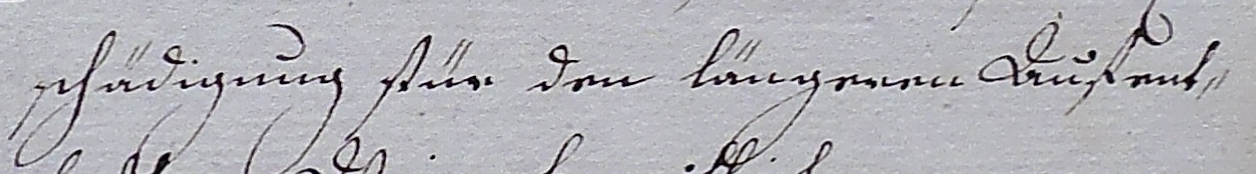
schädigung für den längeren Aufent¬
